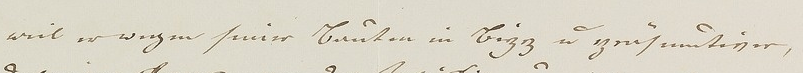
weil er wegen seiner Bauten in Bipp u präsumtiver,
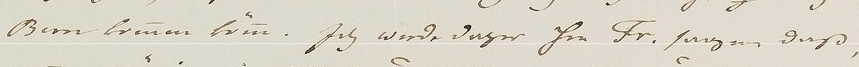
Bern kommen könne. Ich werde daher Hrn Fr. sagen, daß,
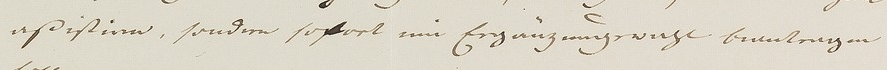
aßistiren, sondern sofort eine Ergänzungswahl beantragen
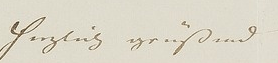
Herzlich grüßend
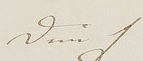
Dein
